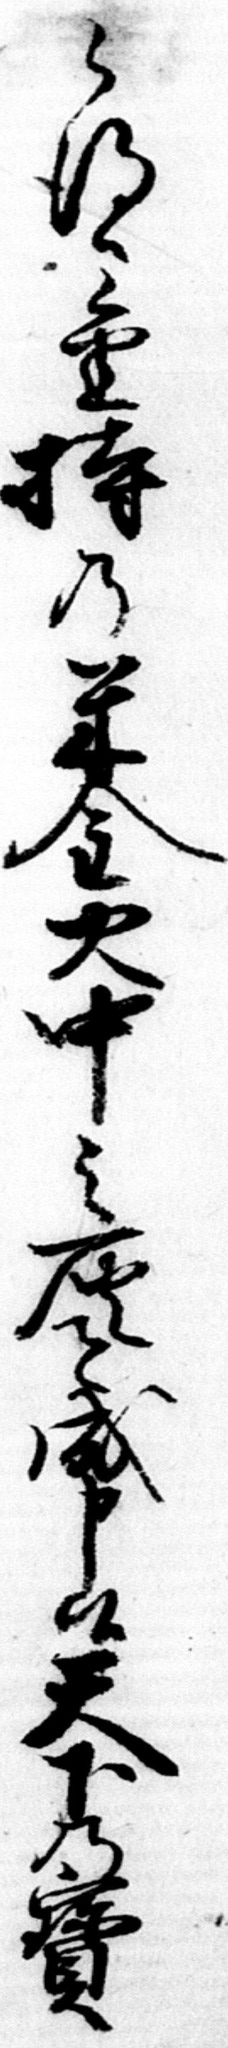候得は金持の米金火中之灰に成申候天下の宝
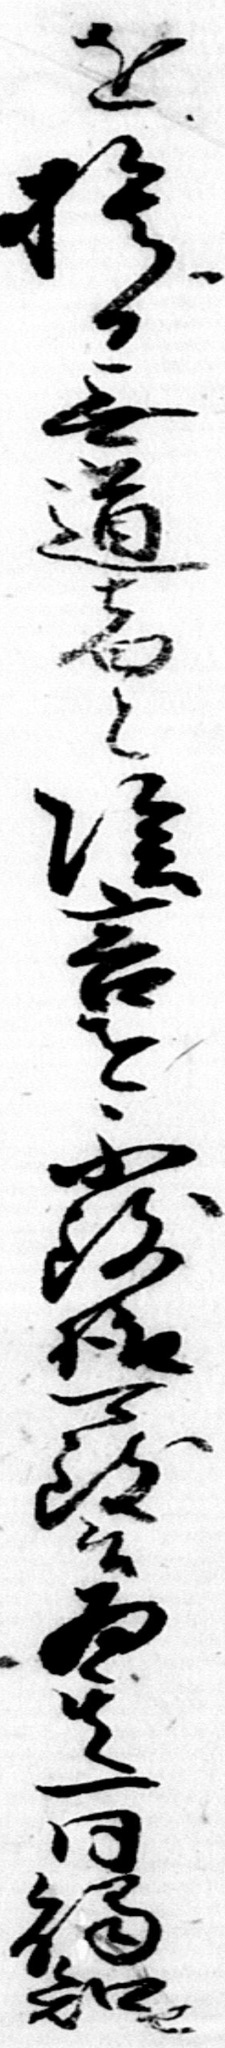を捨る無道者と陰言を不致様可致候為其一同触知せ
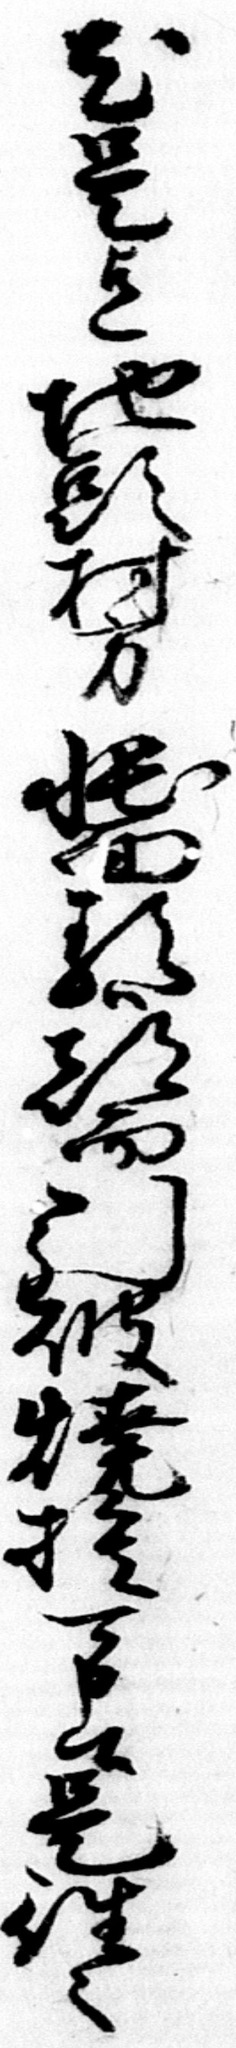尤是迄地頭村方帳面類は都而引破焼捨可申候是往々
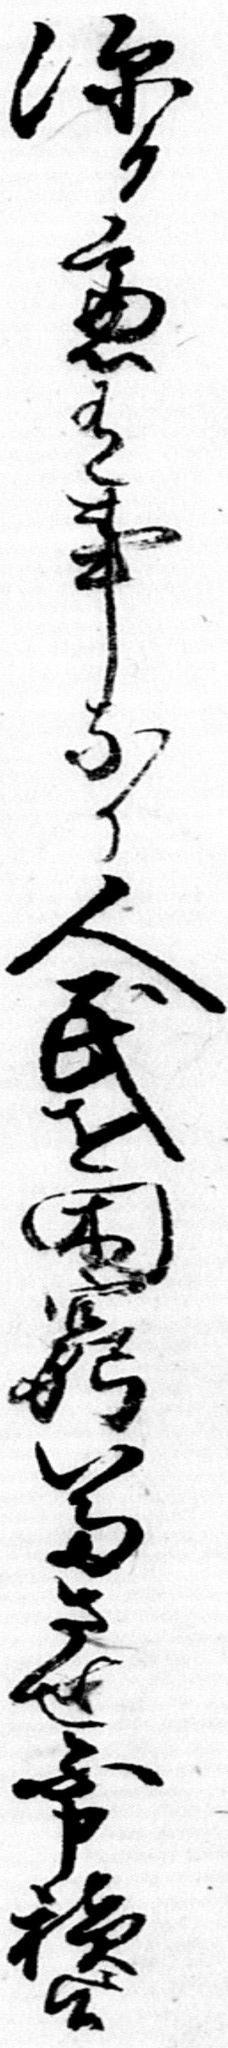深く慮有事なり人民を困窮いたさせ不申積に候
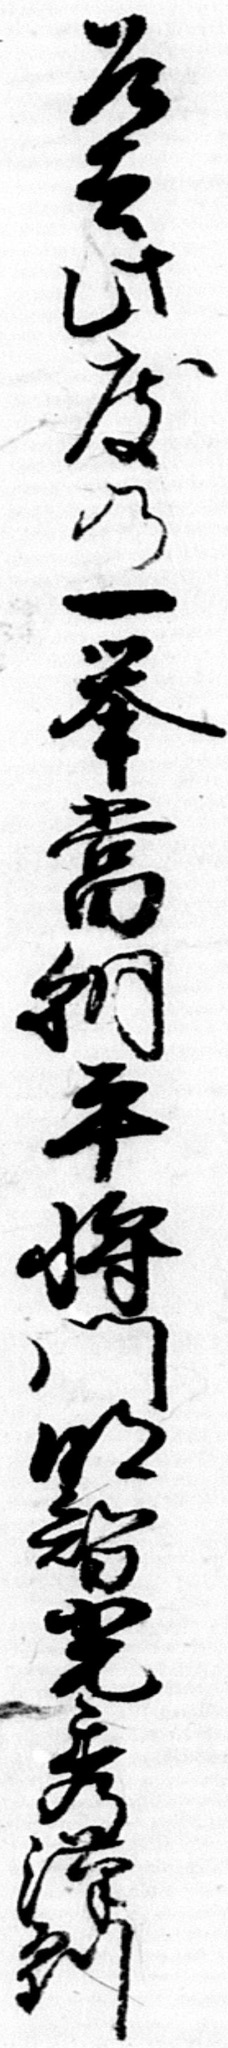乍去此度の一挙当朝平将門明智光秀漢劉
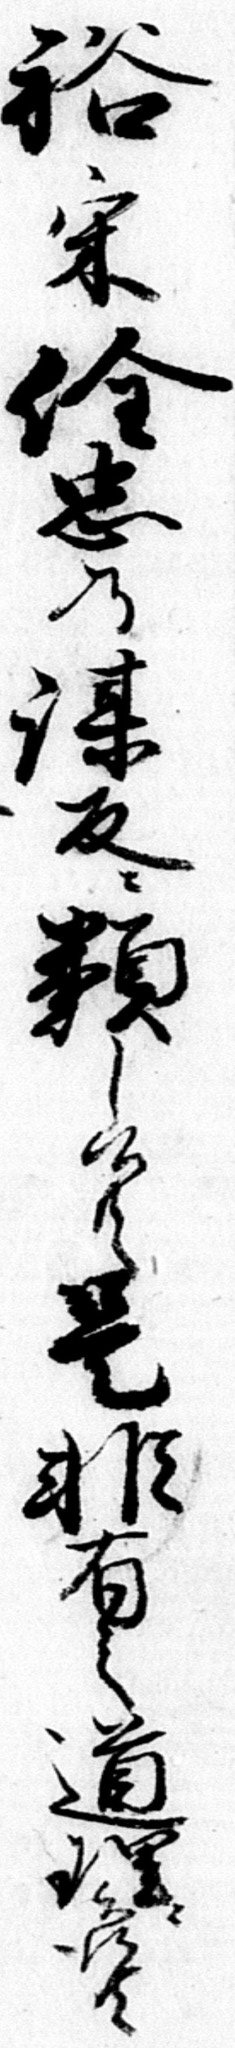裕宋佺忠の謀反に類し候共是非有之道理に候得共
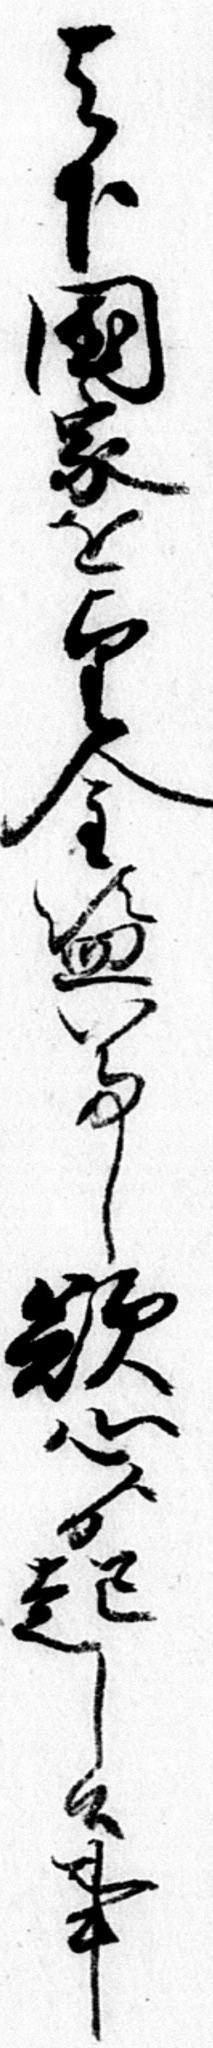天下国家を望金盗いたし欲心ゟ起し候事
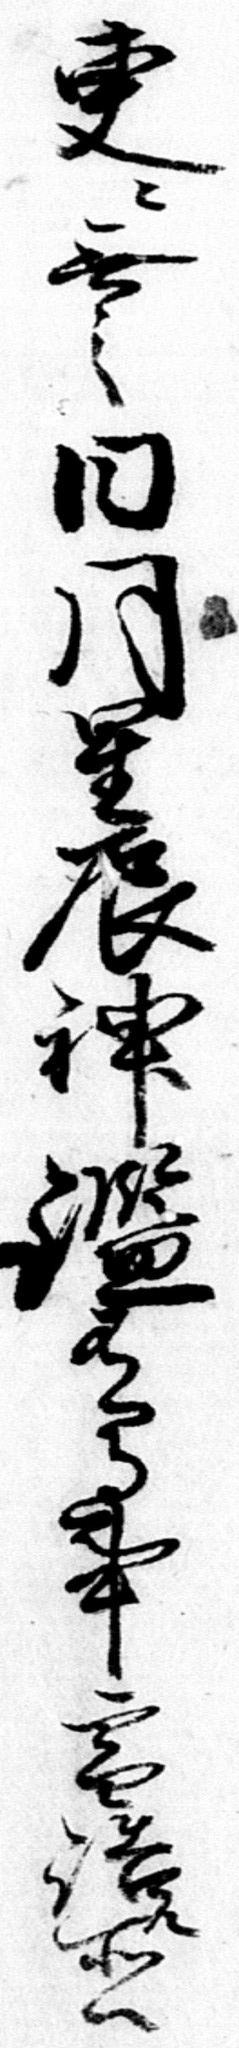更に無之日月星辰神鑑有る事雪詰る所は
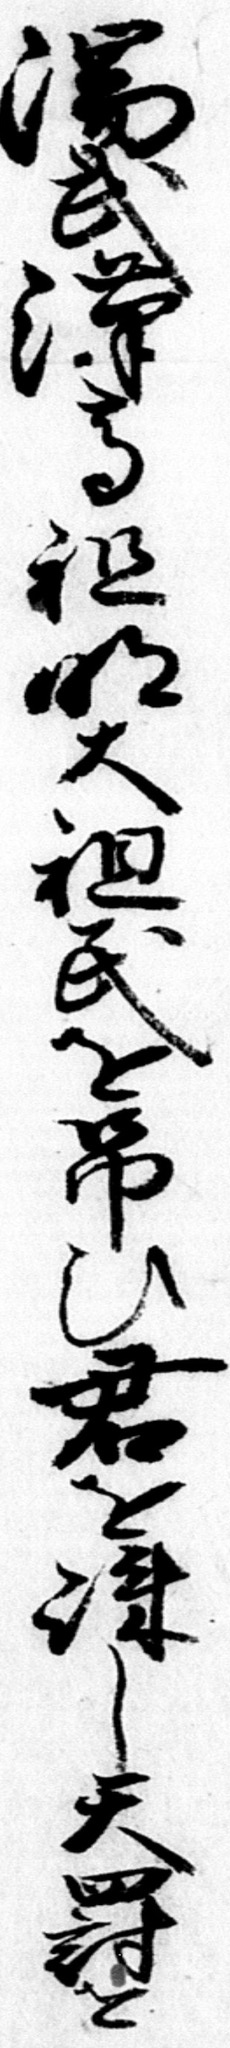湯武漢高祖明太祖民を吊ひ君を誅し天罰を
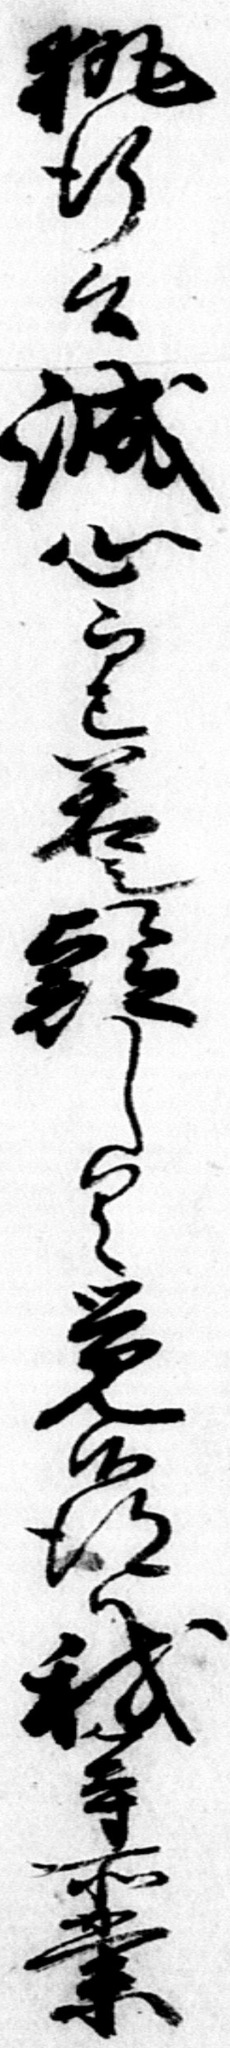執行候誠心而已若し疑しく覚候得は我等所業
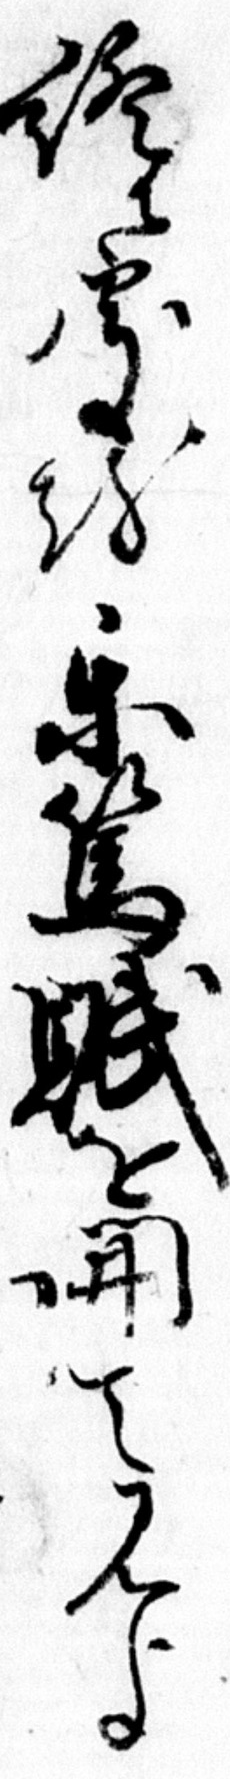終る処を尓篤眼を開て見よ

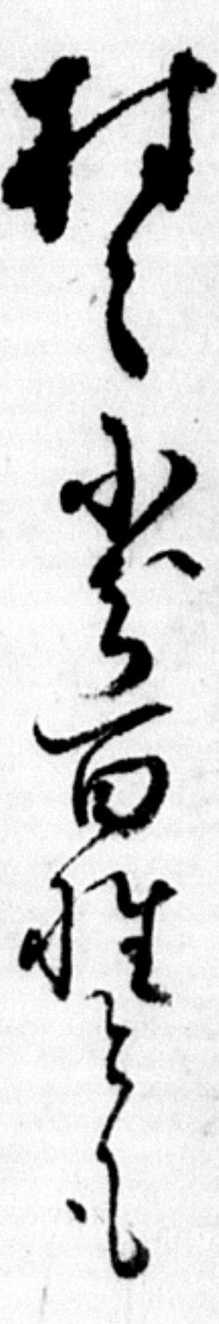村々小前百性とも
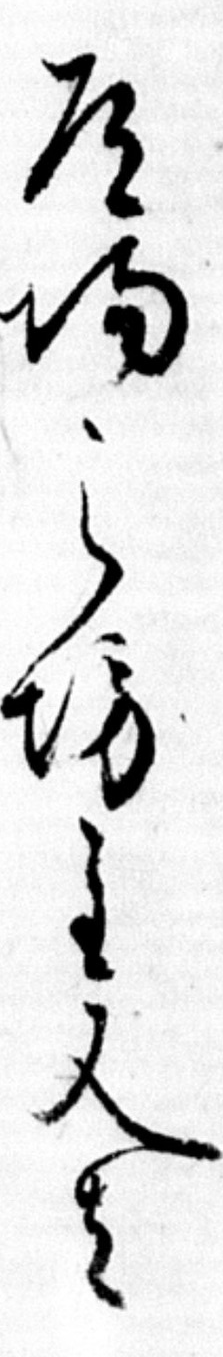道場之坊主又は
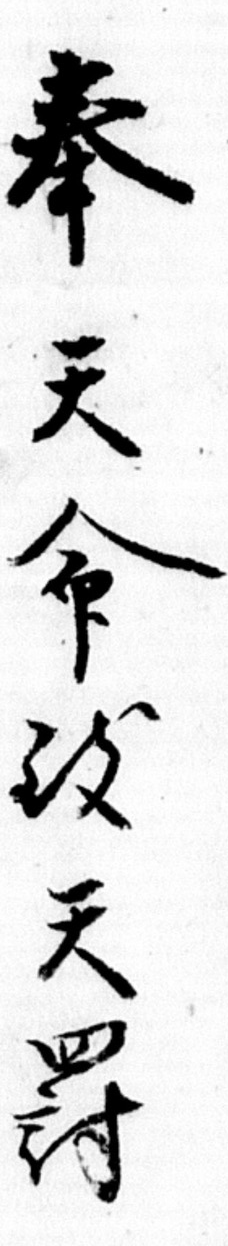奉天命致天罰
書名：大坂一件大塩平八郎存書
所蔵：徳島県立図書館
